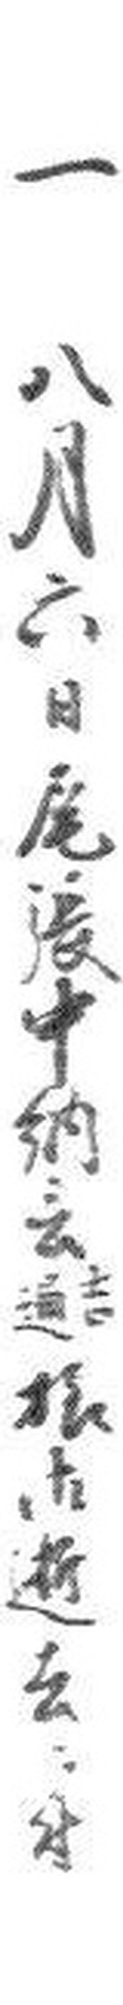一八月六日尾張中納言吉道様御逝去ニ付
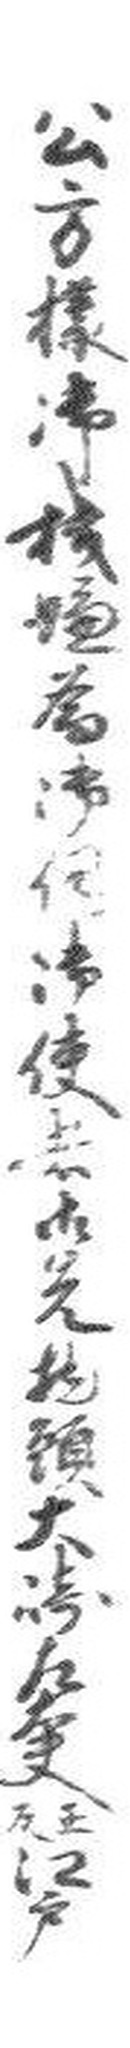公方様御機嫌為御伺御使者御先物頭大崎左太夫正江戸
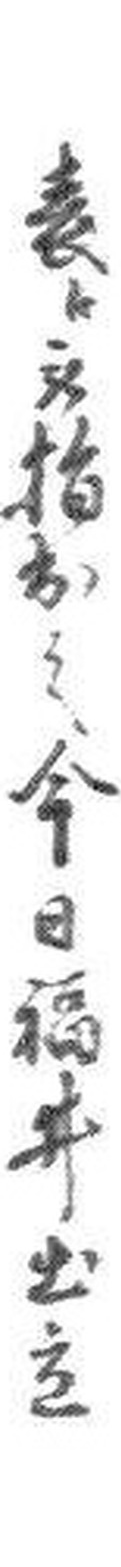表江被指出今日福井出立之

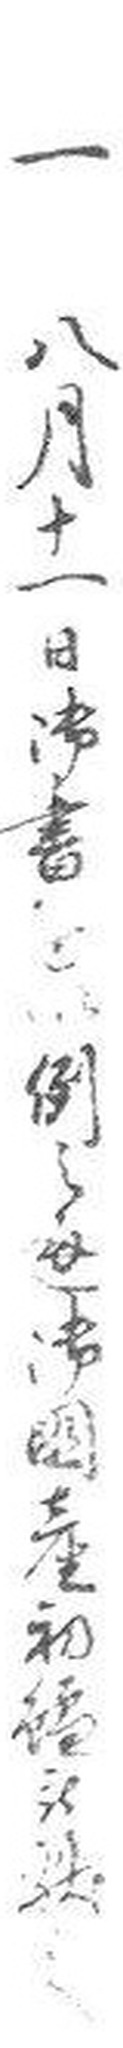一八月十一日御書を以例之通御国産初鱈被献之
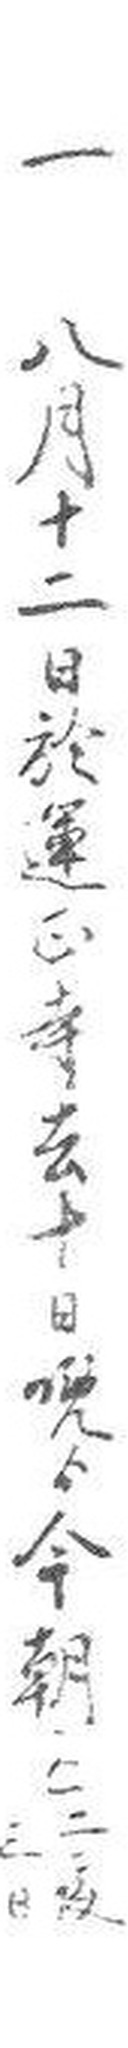一八月十二日於運正寺去十日晩ゟ今朝迄二夜三日
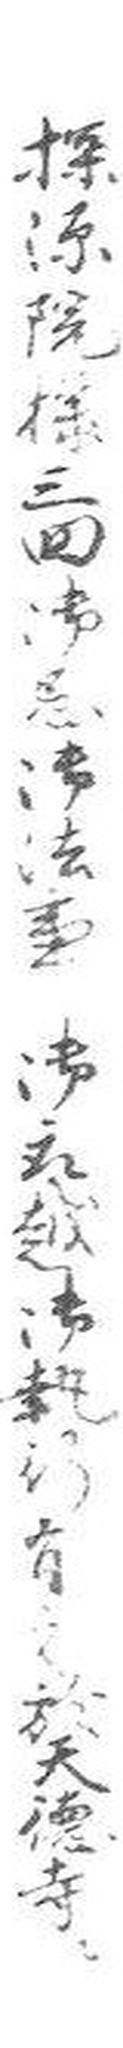探源院様三回御忌御法事御取越御執行有之於天徳寺ニ
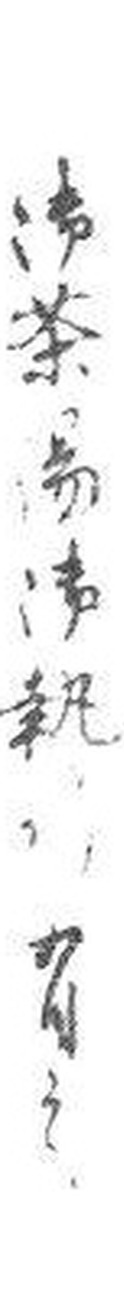御茶湯御執行有之
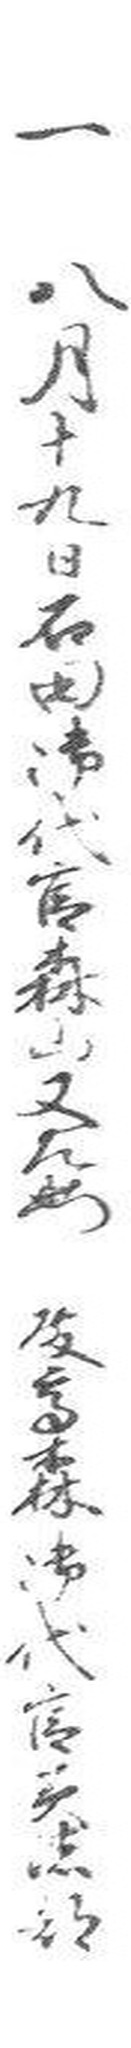一八月十九日石田御代官森山又左衛門殿高森御代官美濃部
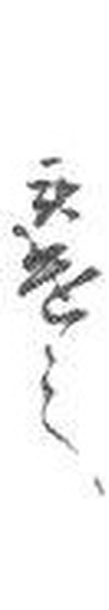被遣之
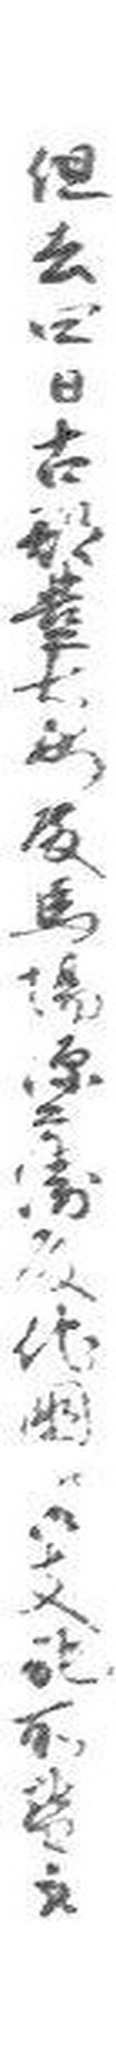但去四日古部豊右衛門殿馬場源兵衛殿代国江御支配取替被
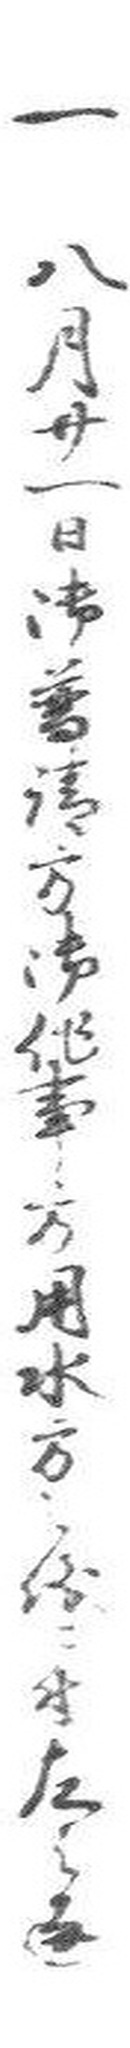一八月廿一日御普請方御作事方用水方之儀ニ付左之通
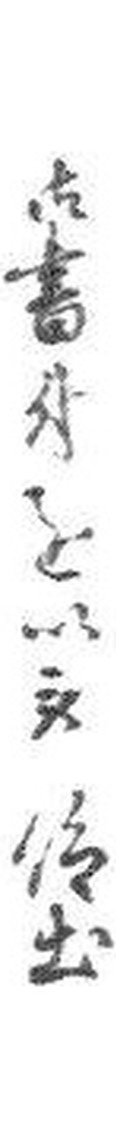御書付を以被仰出
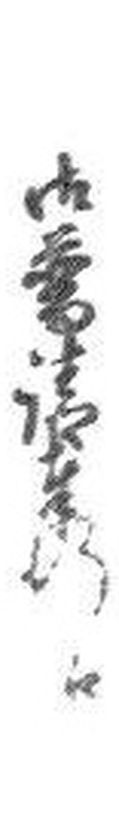御普請奉行江
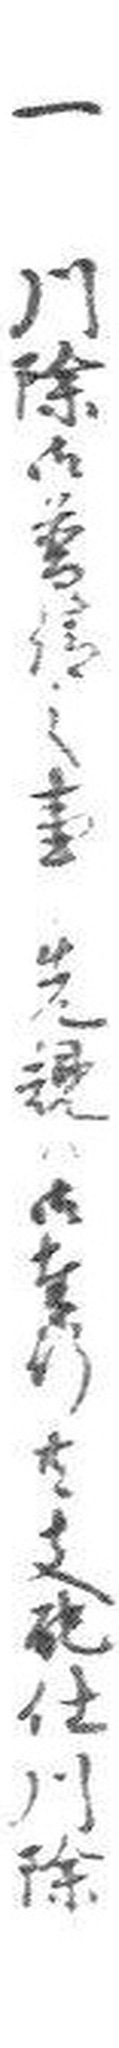一川除御普請之事先規ハ御奉行共支配仕川除
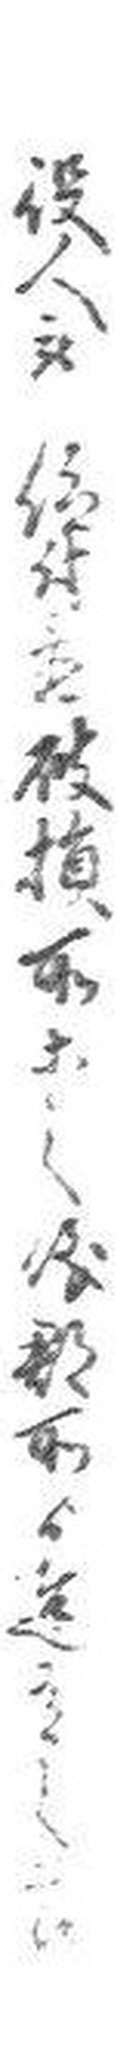役人被仰付置破損所等之儀郡所ゟ達有之節
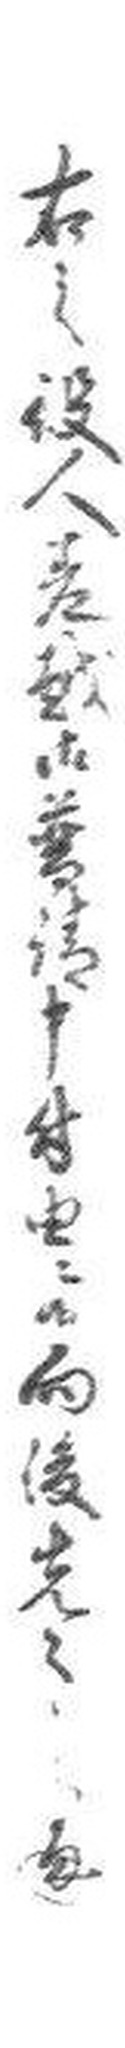右之役人差越御普請申付由ニ候向後先々之通
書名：家譜 二十九 吉邦公 従正徳二年到正徳三年
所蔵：福井県文書館 Fukui Prefectural Archives
